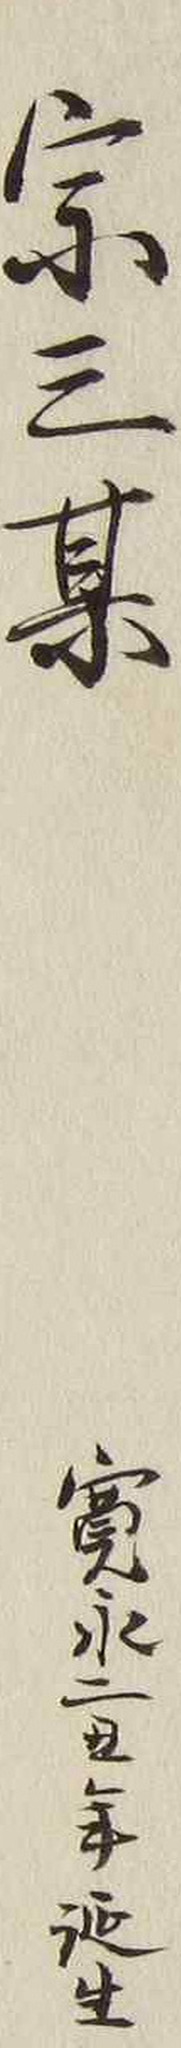宗三某寛永二辰年誕生

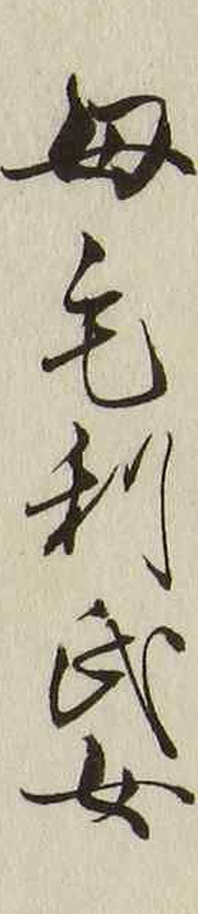母毛利氏女
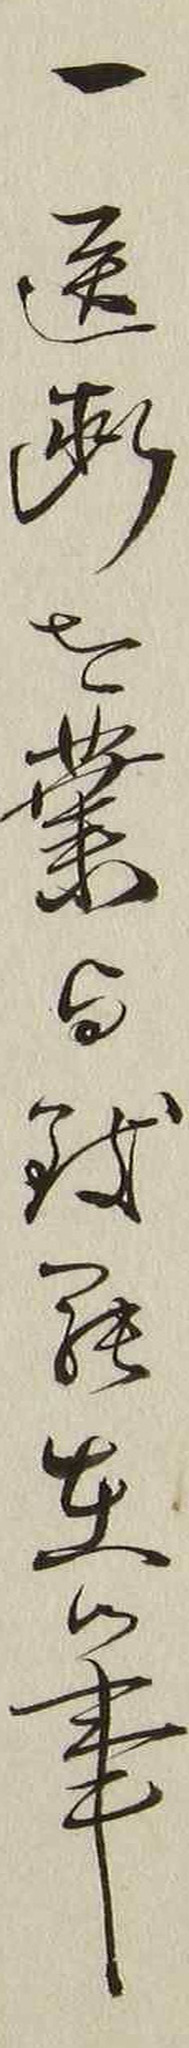一医術を業と致罷在候事
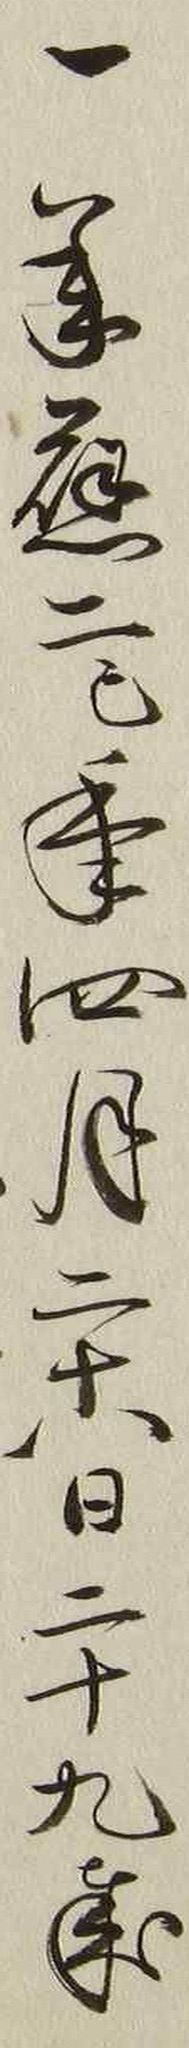一承応二巳年四月二十八日二十九歳
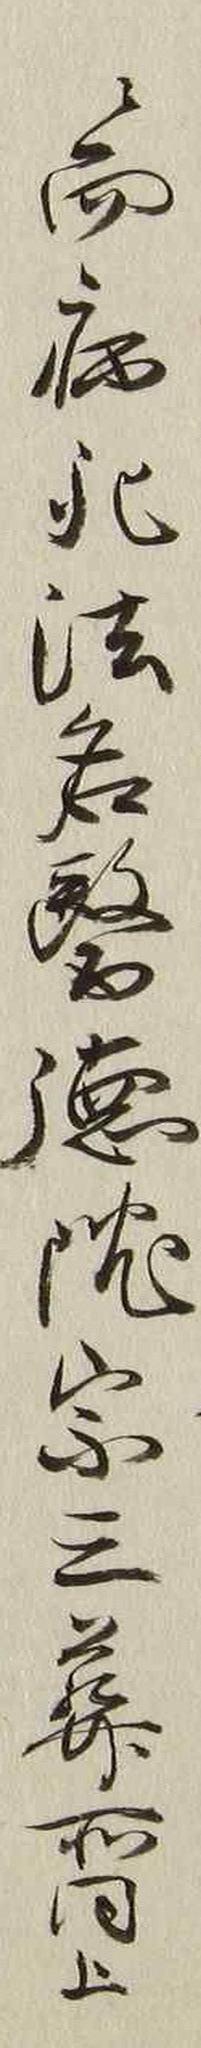ニ而病死法名医徳院宗三葬所同上
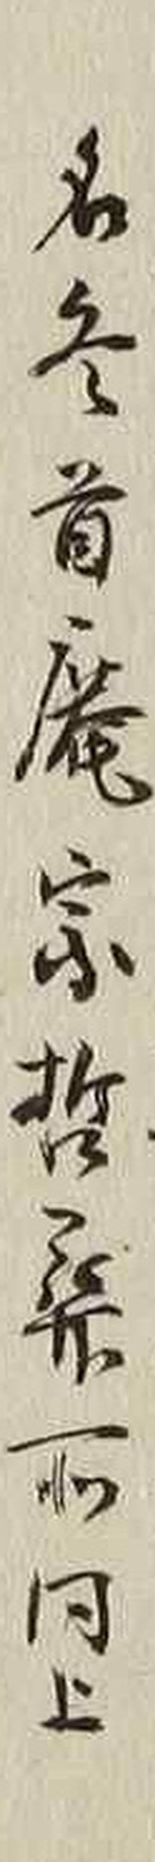名冬首庵宗哲葬所同上
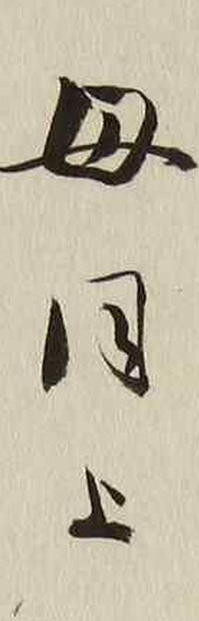母同上
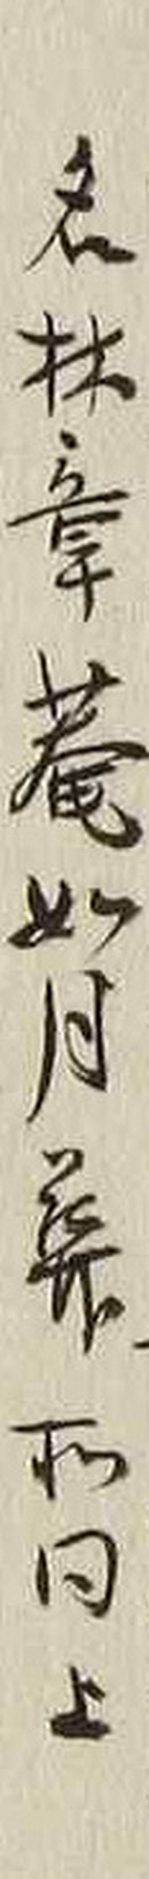名冬首庵宗哲葬所同上
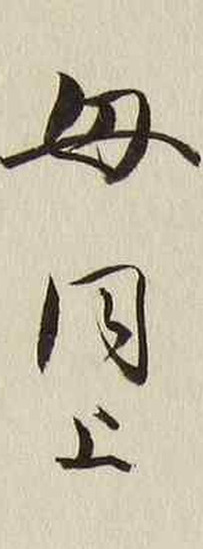母同上

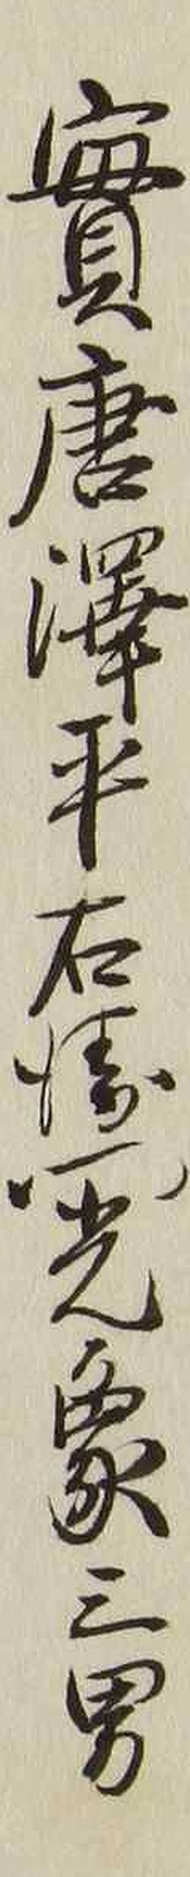実唐沢平右衛門光象三男
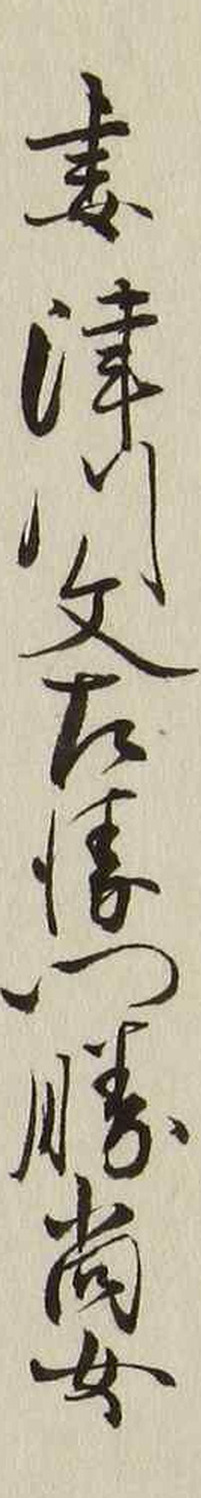妻津川文左衛門勝尚女
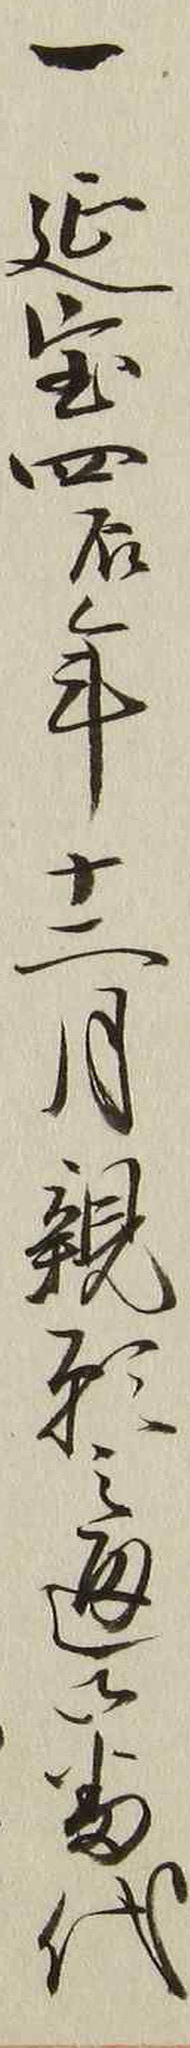一延宝四辰年十二月親願之通御番代
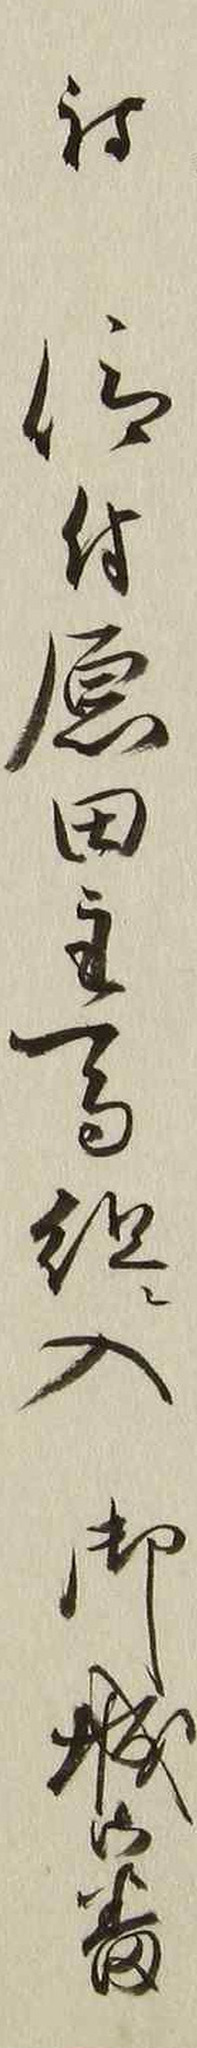被仰付原田主馬組ニ入御城御番
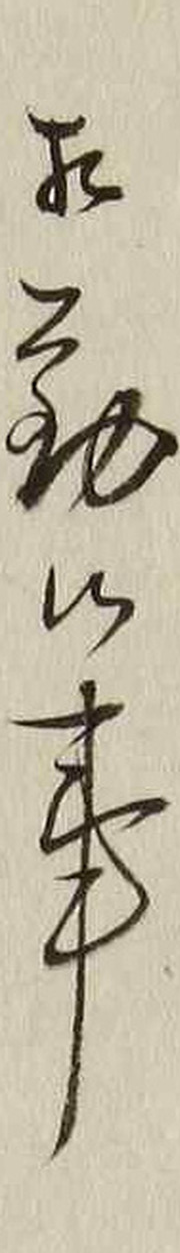相勤候事
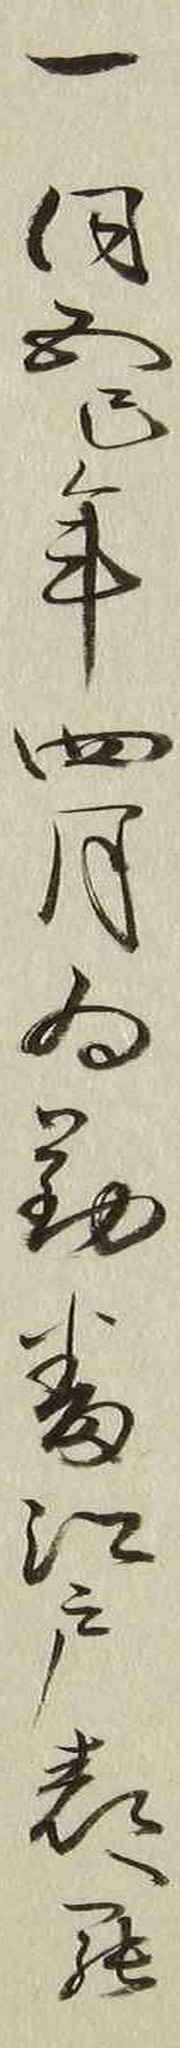一同五巳年四月為勤番江戸表ㇸ罷
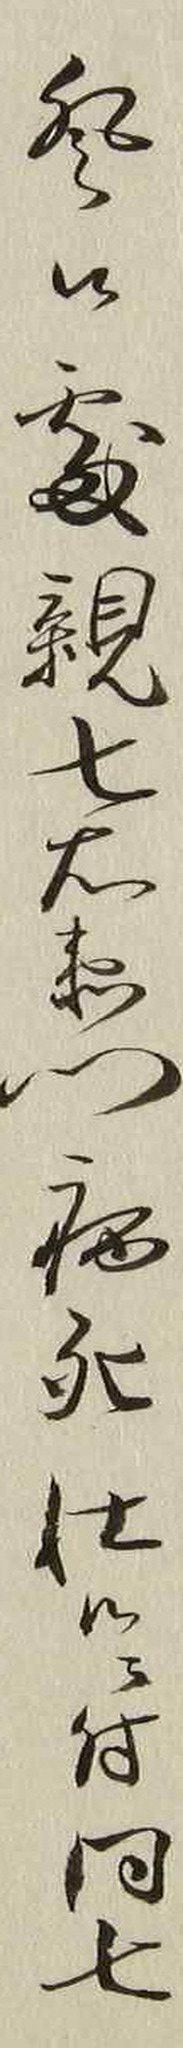登候処親七右衛門病死仕候ニ付同七
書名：諸士系譜　巻之163　な之部5
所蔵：会津若松市立会津図書館
